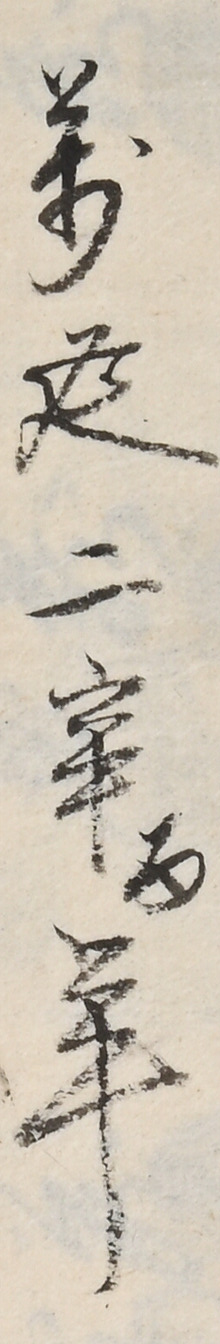万延二辛酉年

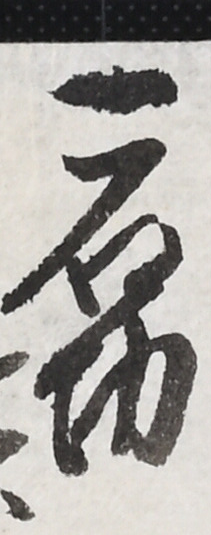一石切
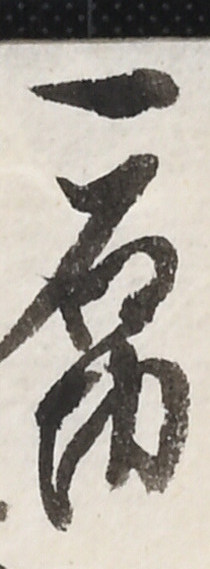一石切
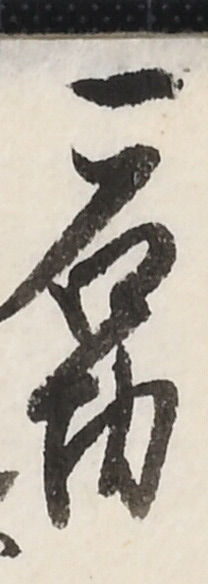一石切
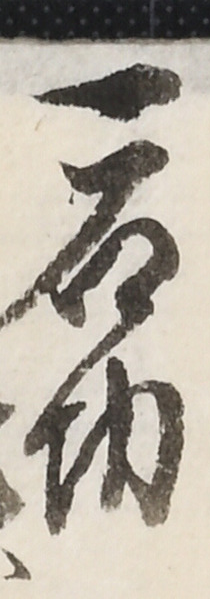一石切
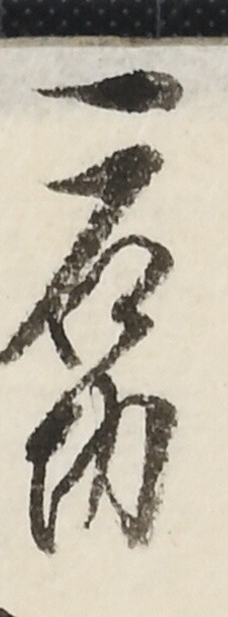一石切
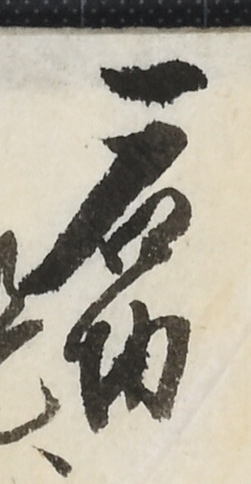一石切

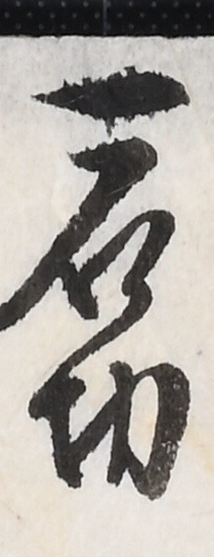一石切
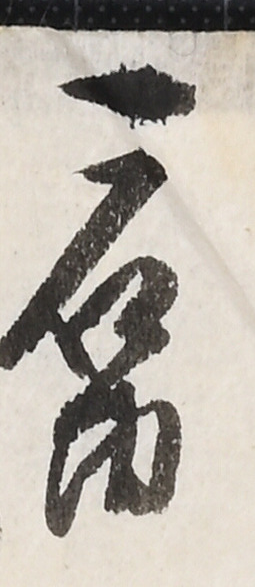一石切
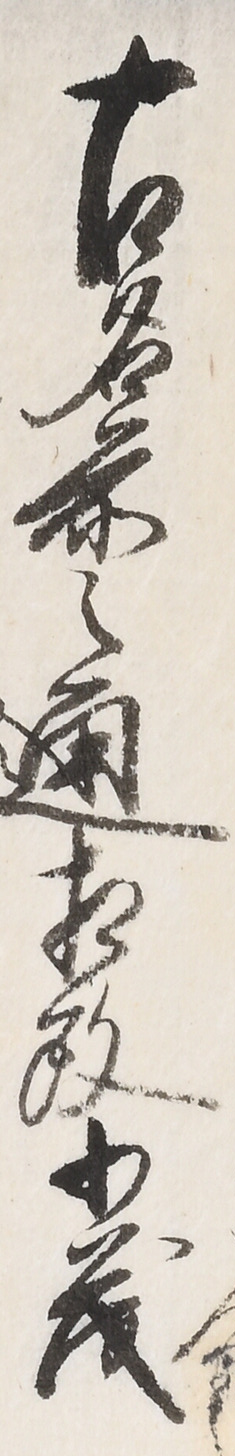右名前之通相改少も
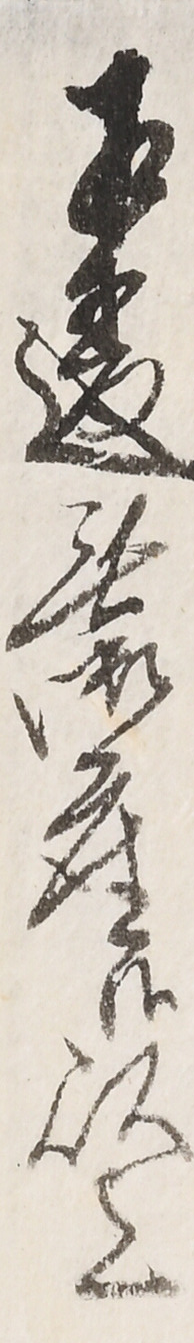相違無御座候以上
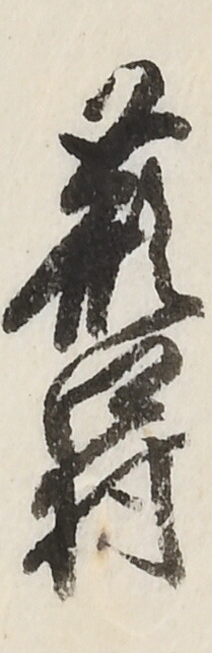荊口村
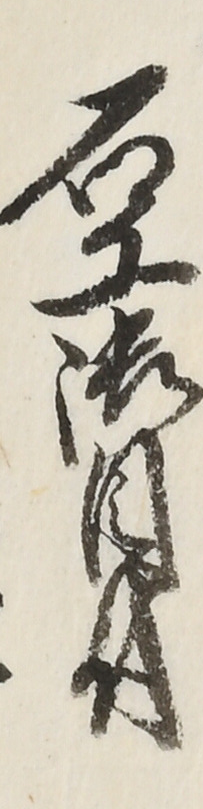石工御目付
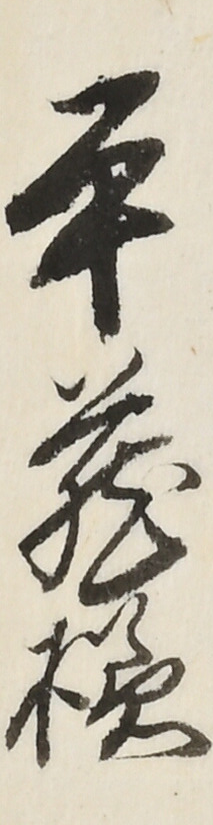平蔵様
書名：萬延二辛酉年二月旅出石切職名前帳
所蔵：伊那市立高遠町図書館・合同会社AMANE
